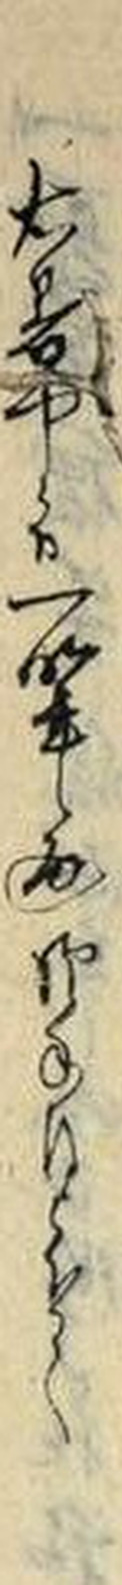右暑中ニ付一昨年之通御手自被下之

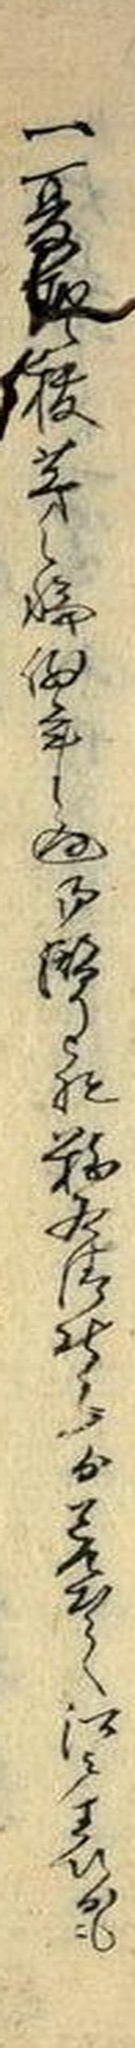一夏越之祓茅之輪例年之通御潜り被遊粕谷清次郎ゟ差出之江戸表ゟも
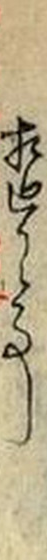相廻り候事
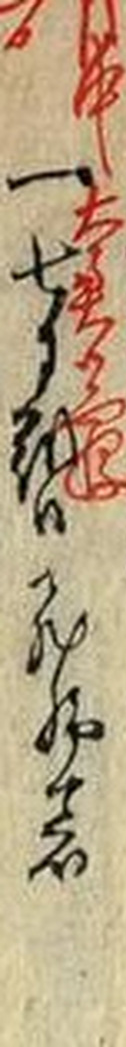一七月朔日飛脚着
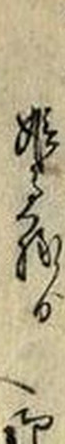姫君様ゟ
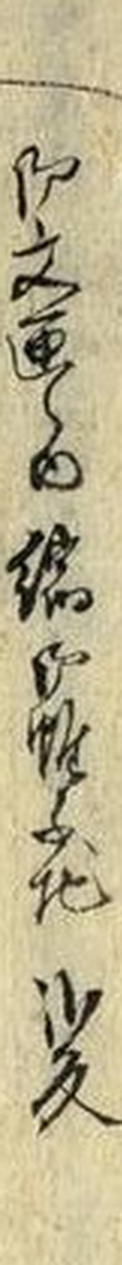御文匣之内縞御帷子地弐反
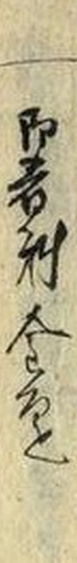御肴料金百疋
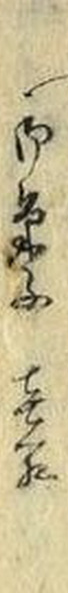御菓子壱箱
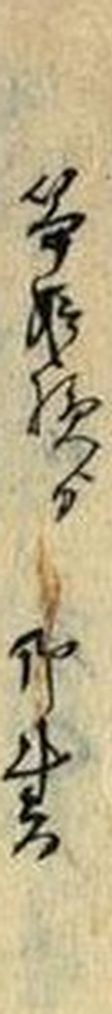箏姫様ゟ御書
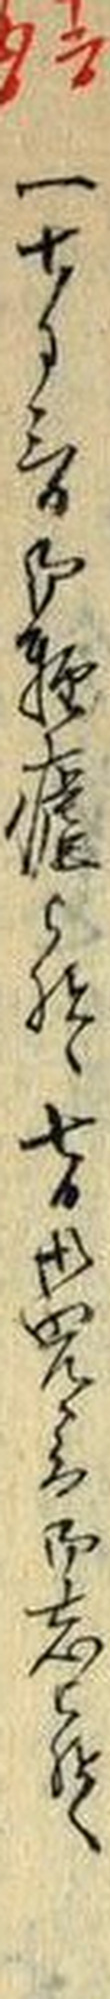一七月三日御軽瘧被遊候七日御覚ニ而御忘被遊候
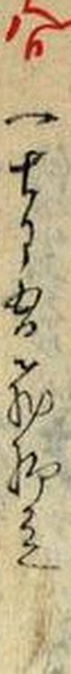一七月五日飛脚立
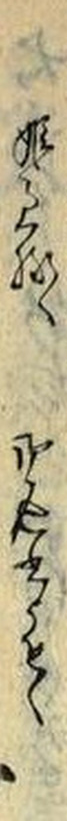姫君様へ御返書被進之
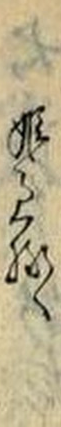姫君様ゟ
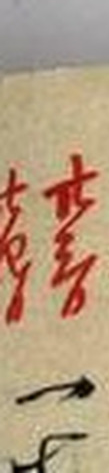廿四日
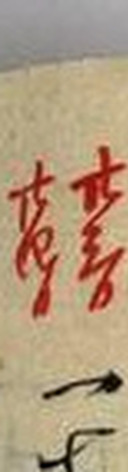廿四日
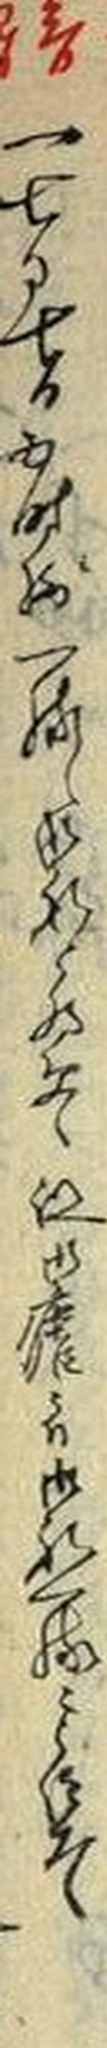一七月七日五時揃一統御礼被為受候但御瘧ニ付御礼一統ニ被仰出候
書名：少傅日録抄（斉承付側向頭取日記、在国）
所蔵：福井県文書館 Fukui Prefectural Archives
